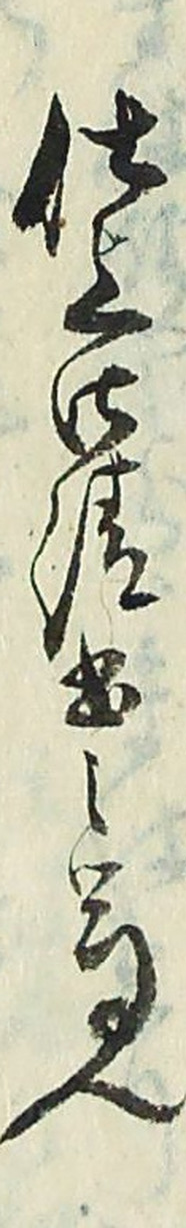仕上御請書之覚
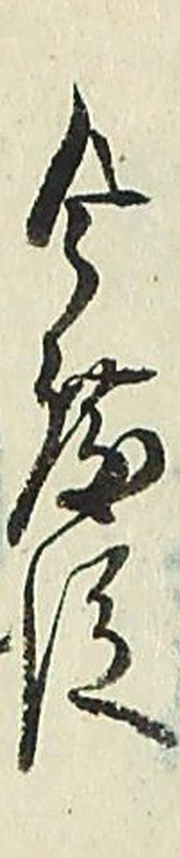今度従
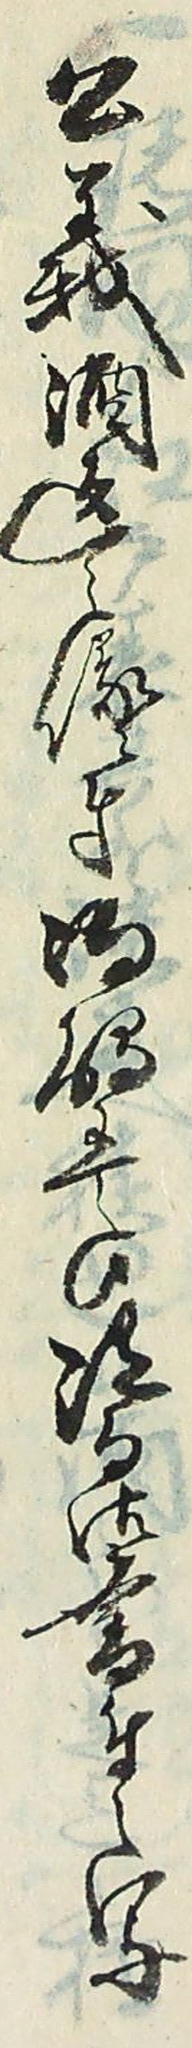公義酒造之儀に付御触有之候随而御書付之写
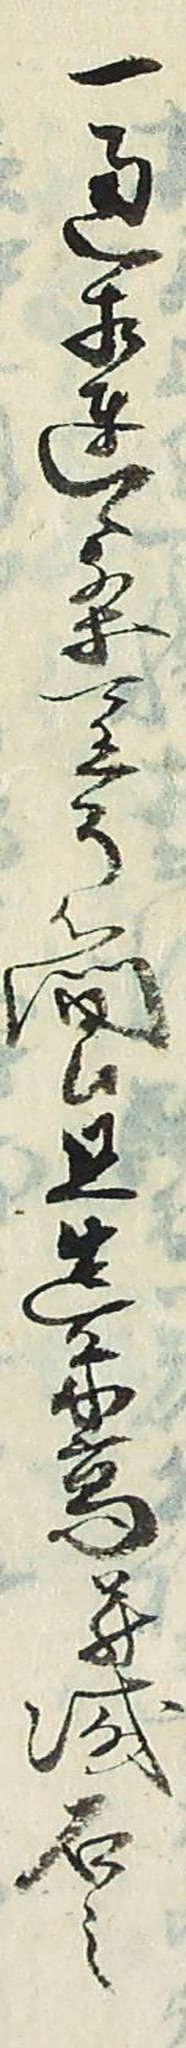一通相達候条可有了簡候且造米高幷減石之
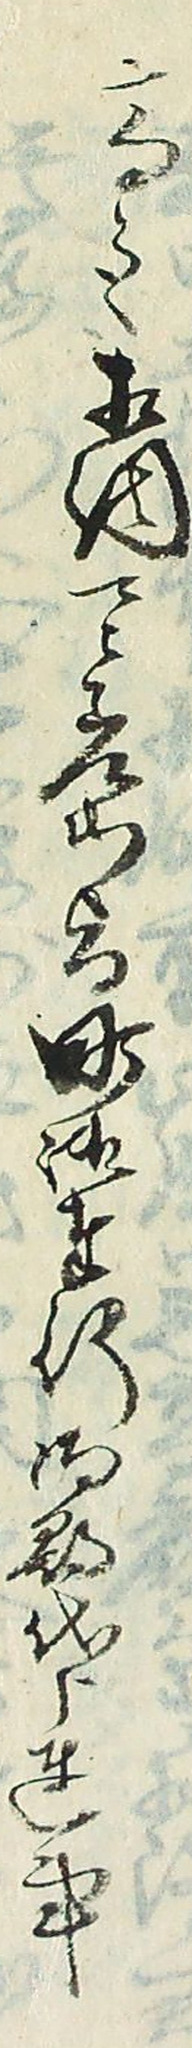高とも相調可被差出旨町御奉行御郡代申達事
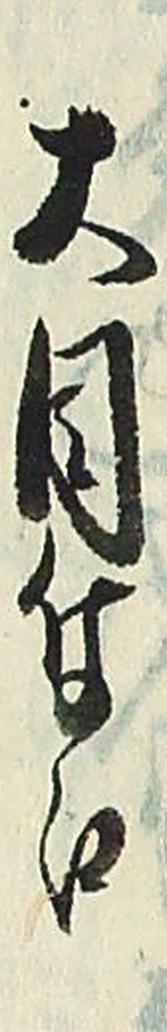大目付江
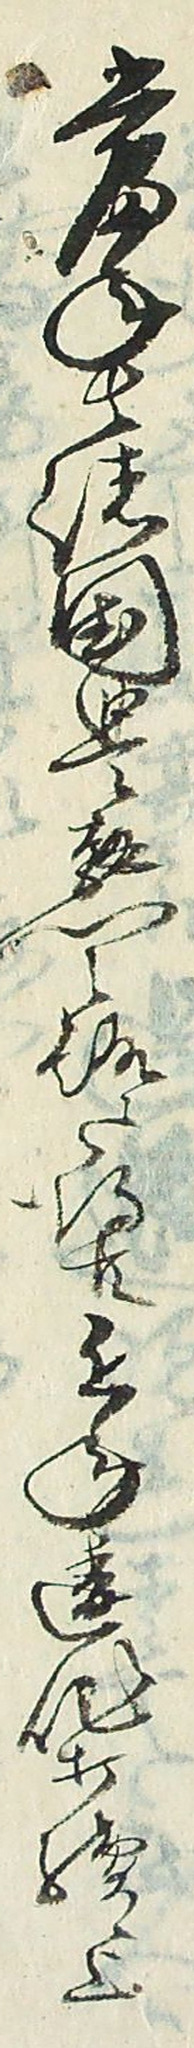当年は諸国豊熟の趣に候得共近年違作打続候上
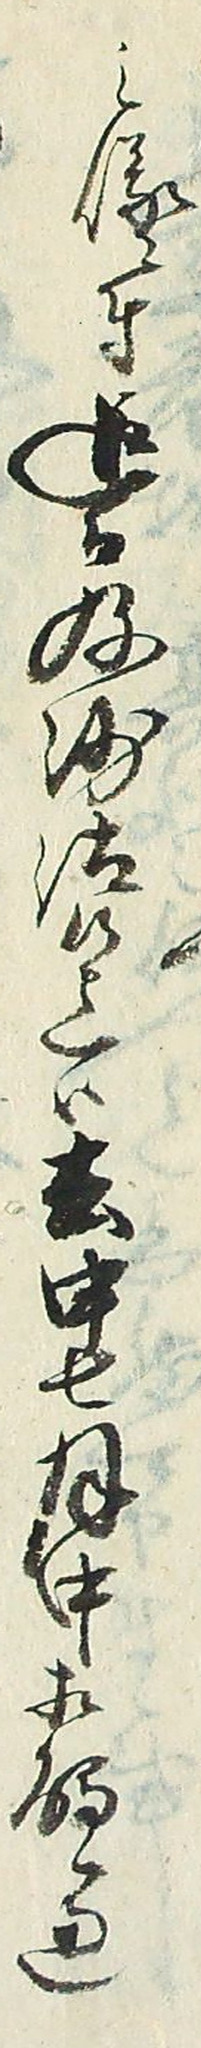之儀に付追而及沙汰候迄は去申七月中相触候通
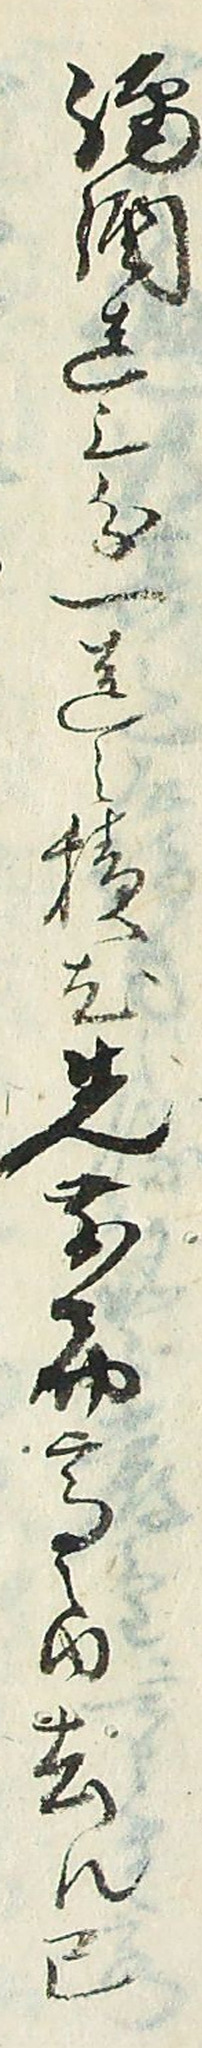彌酒造三分一造之積尤先前届高之内去ル巳
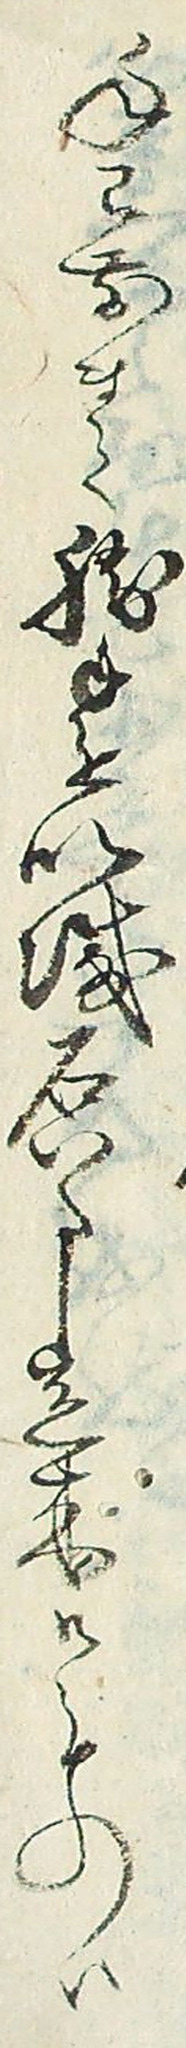年已前まて勝手を以減石いたし造来候ものは

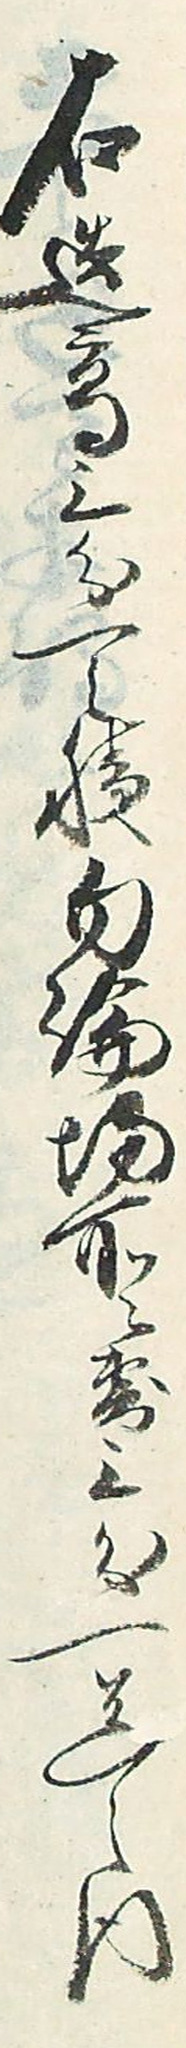右造高三分一之積勿論場所に寄三分一造之内
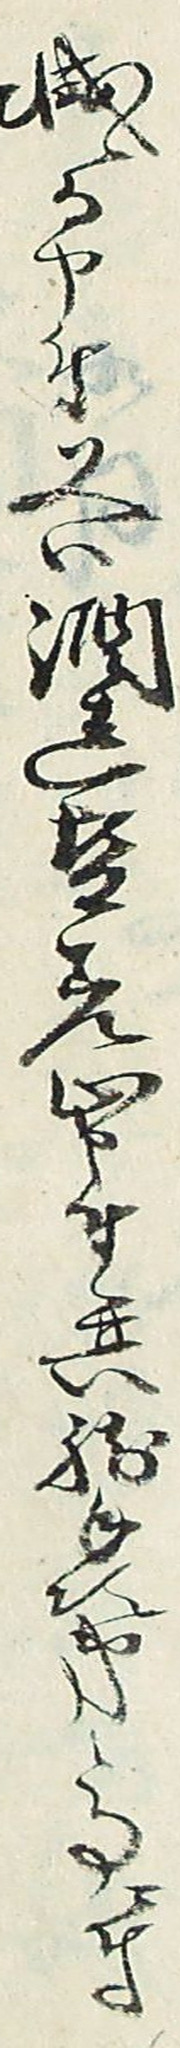減候而申付又は酒造皆差止申付候共其勝手次第之事に付
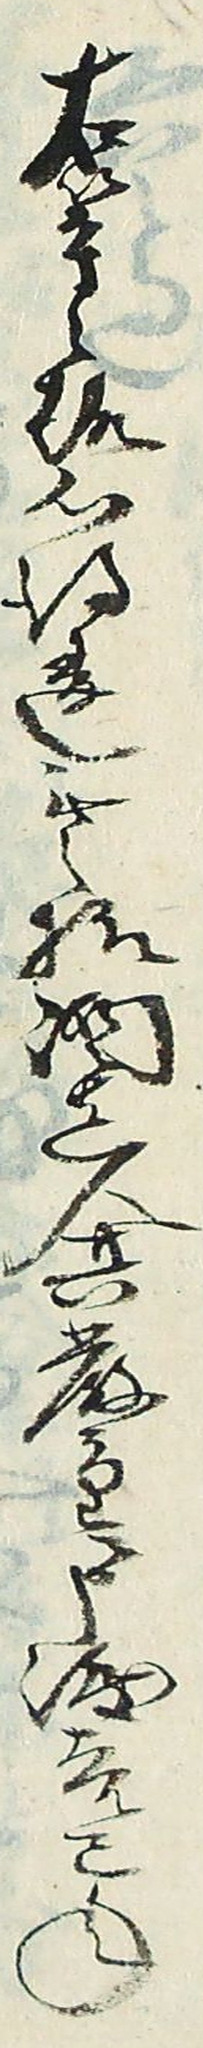右等之趣心得違無之様酒造人共厳重に申渡去る巳年
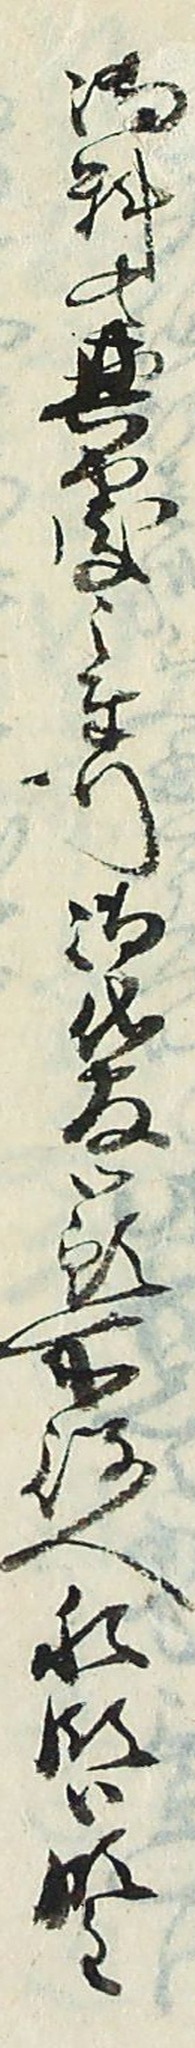御料は其処之奉行御代官御預所役人私領は領主
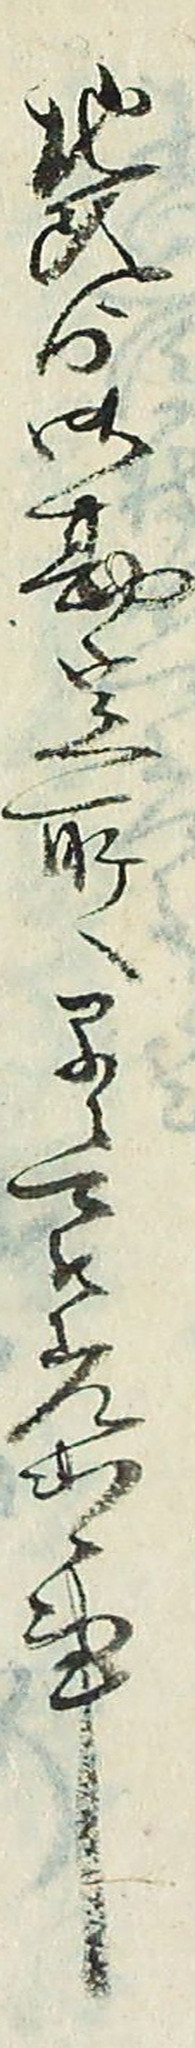地頭ゟ御勘定所へ早々可被差出候事
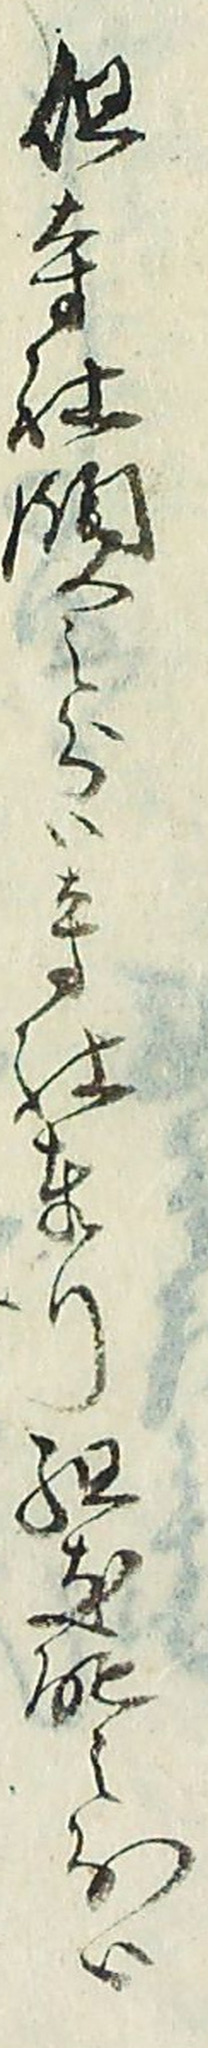但し寺社領之分は寺社奉行組支配之分は
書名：諸御用御□受書控
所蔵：鳴門教育大学 Naruto University of Education
